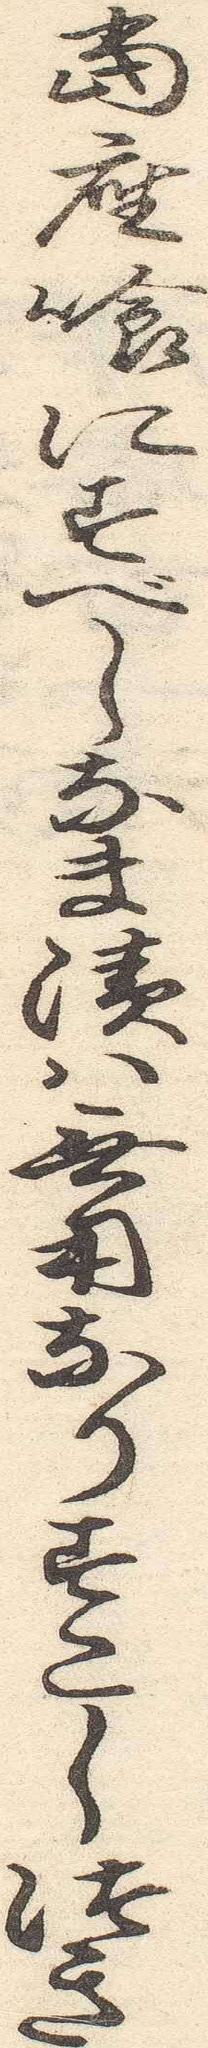当座喰にすべしなま漬は無用なりすこしつき
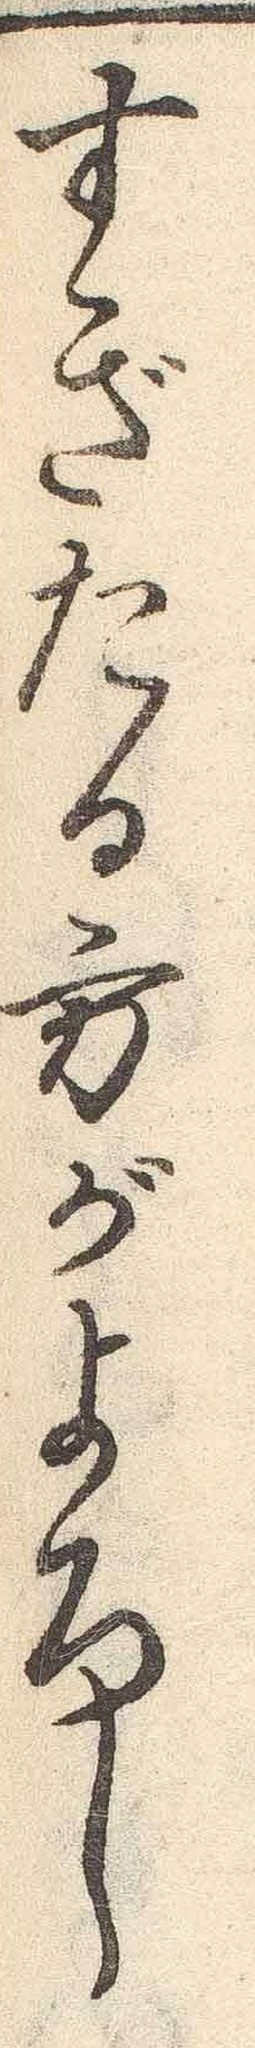すぎたる方がよろし
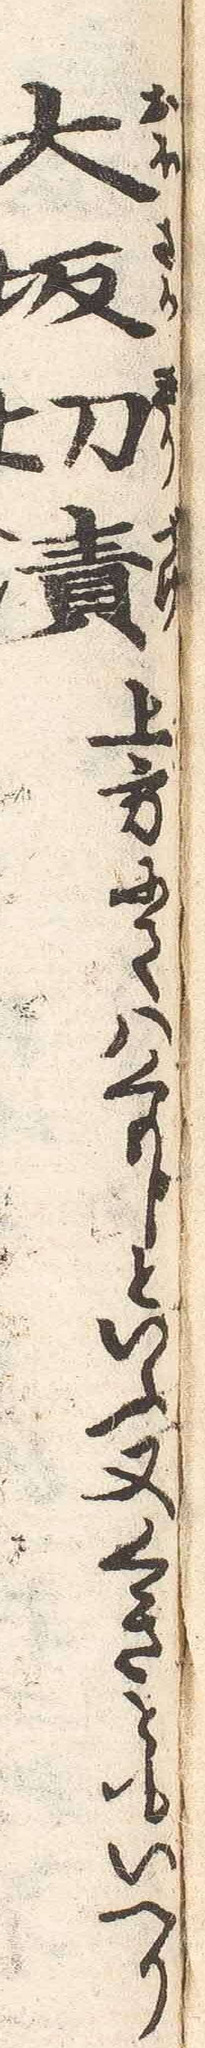大阪切漬上方にてはくもじといふ又くきともいへり
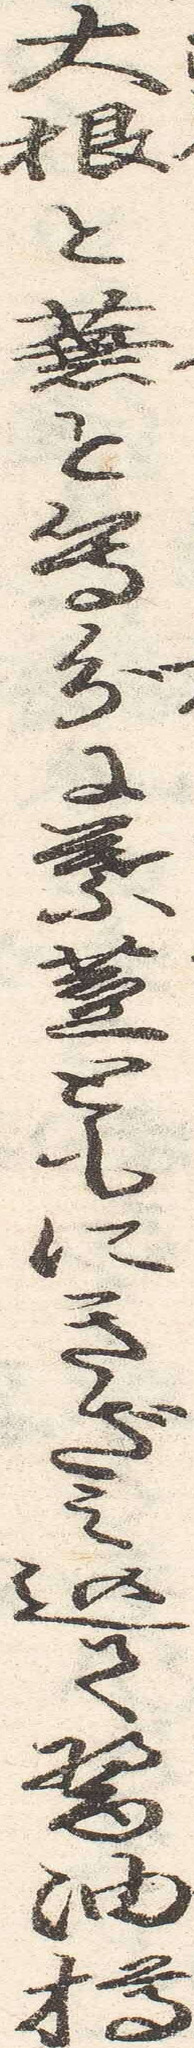大根と蕪と等分に葉茎ともにきざみ込て醤油樽
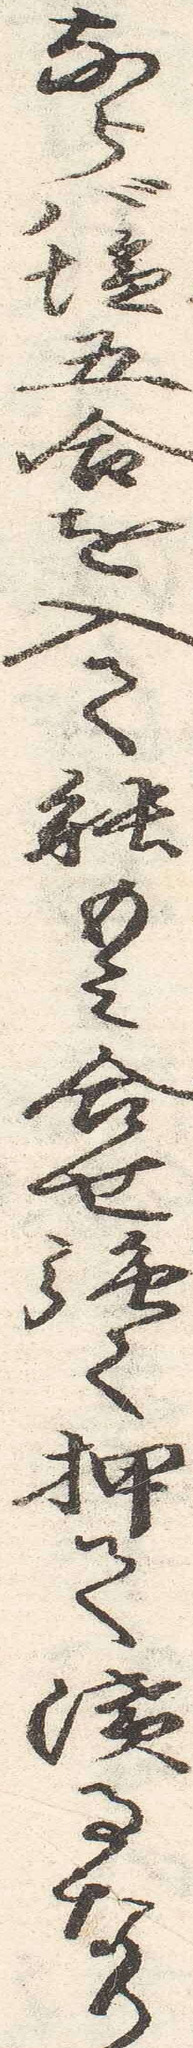ならば塩五合を入て能もみ合せ強く押て漬るなり
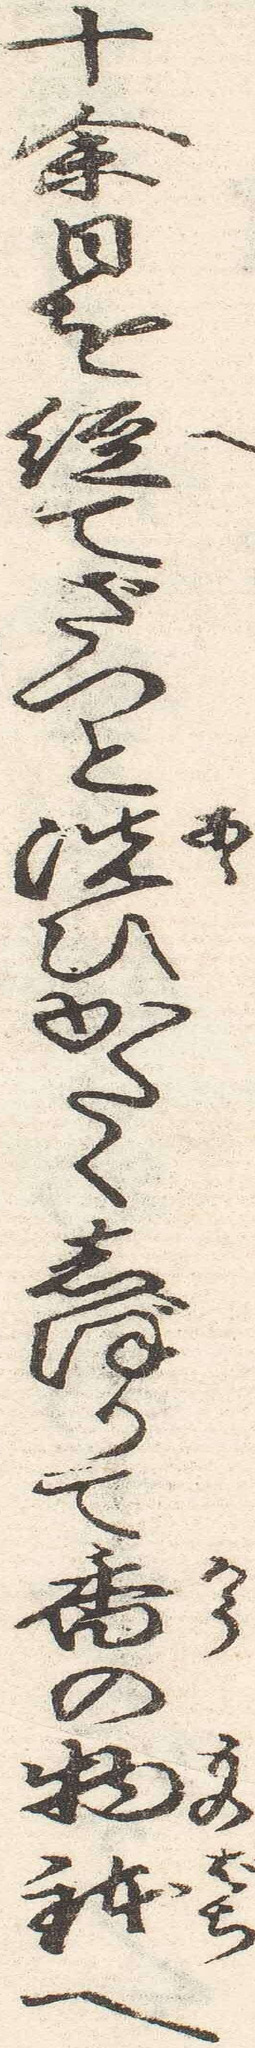十余日を経てざつと洗ひかたくしぼりて香の物鉢へ
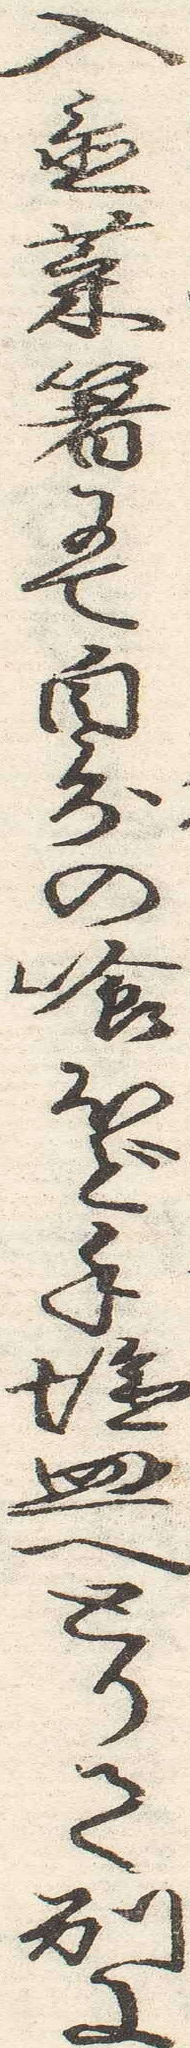入置菜箸にて自分の喰ほど手塩皿へとりて別に
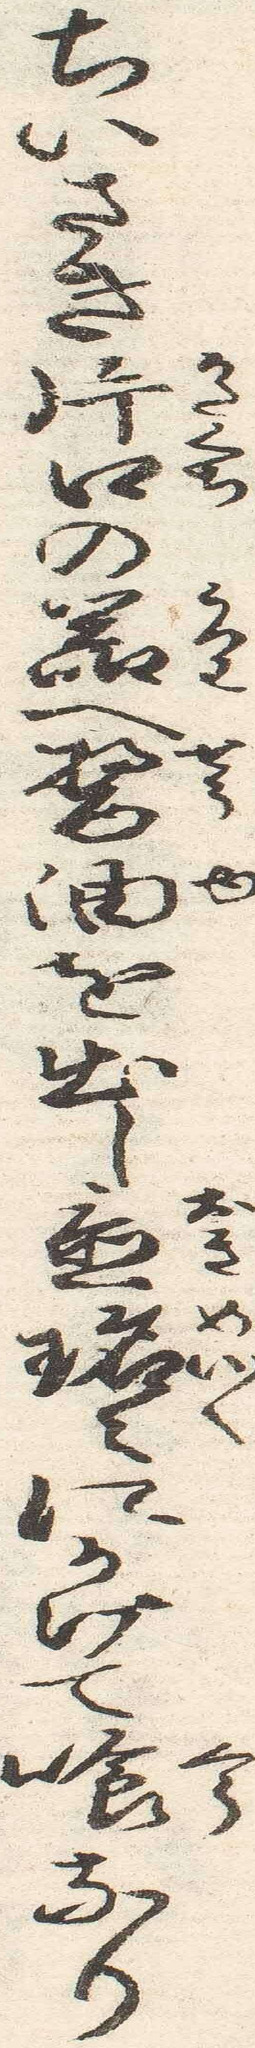ちいさき片口の器へ醤油を出し置銘々にかけて喰なり
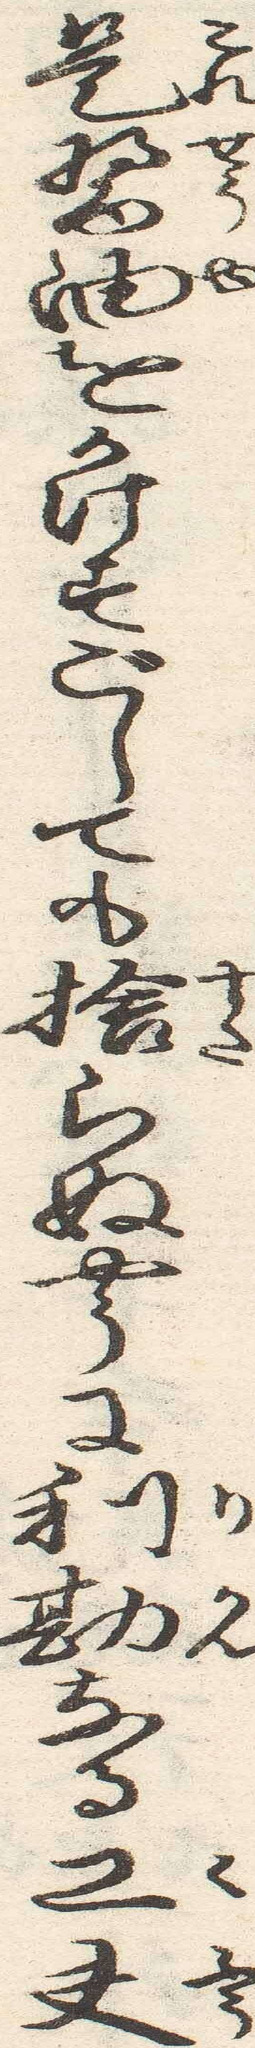是醤油をかけすごしても捨らぬやうに利勘なる工夫
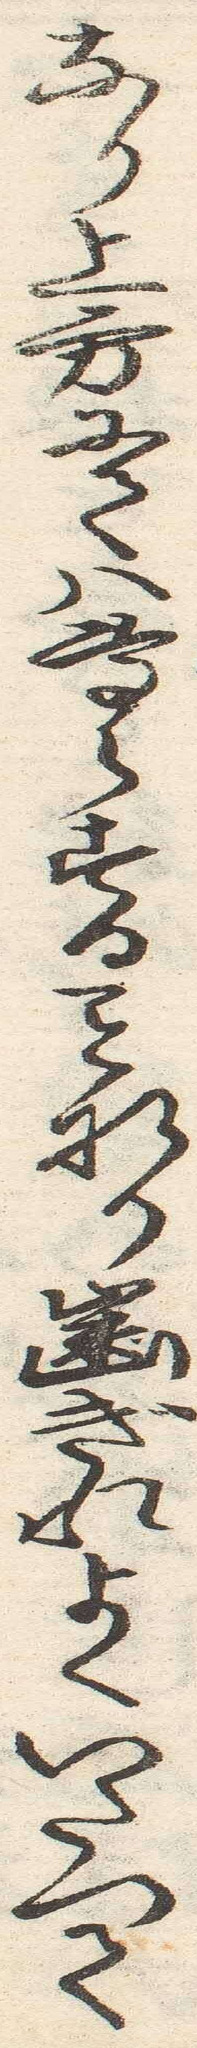なり上方にては専らすることなり歯ぎれよくいたつて
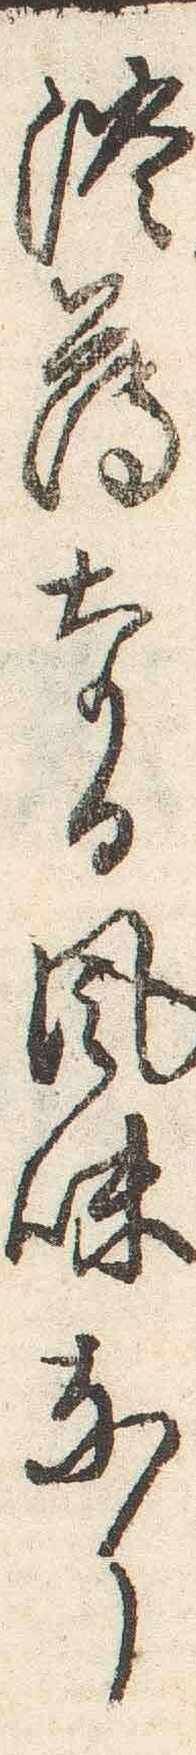淡薄なる風味なり

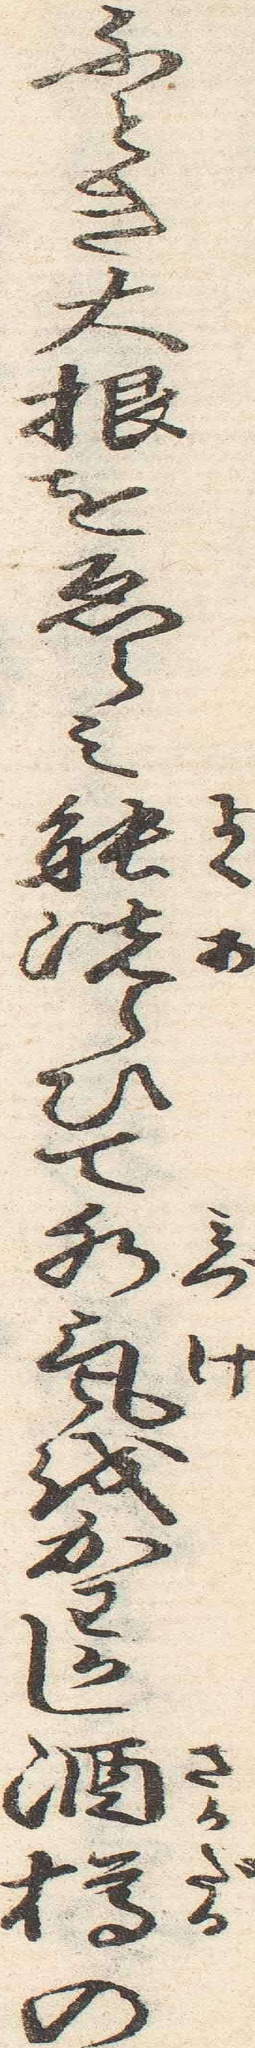ふとき大根をえらみ能洗らひて水気をかわかし酒樽の
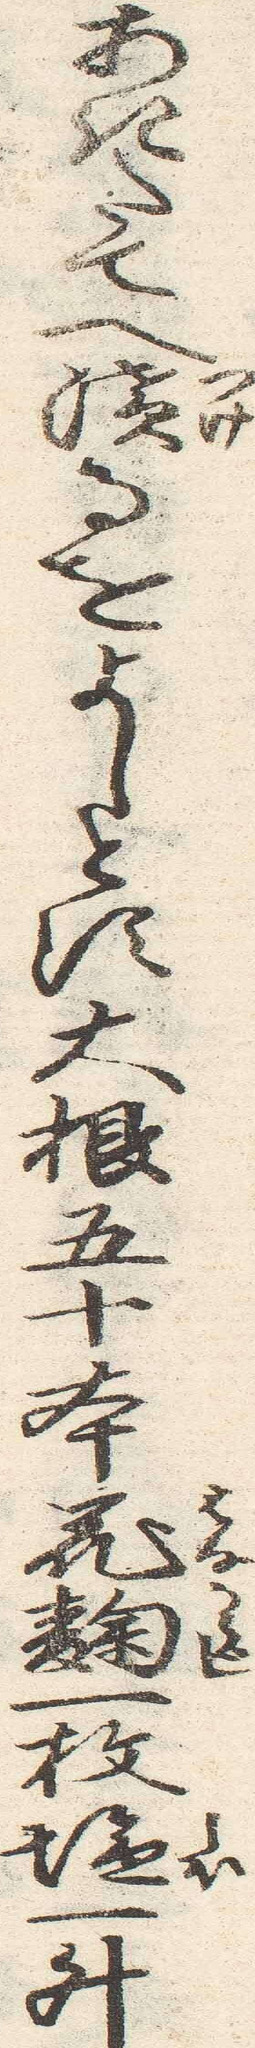あきたてへ漬るをよしとす大根五十本花麹一枚塩一升
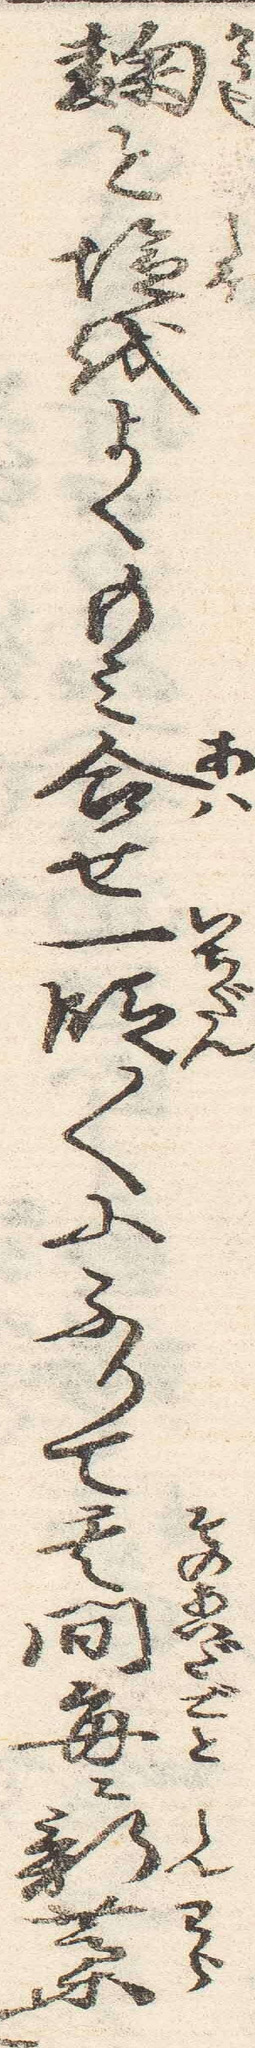麹と塩をよくもみ合せ一段〳〵にふりて其間毎に新藁を
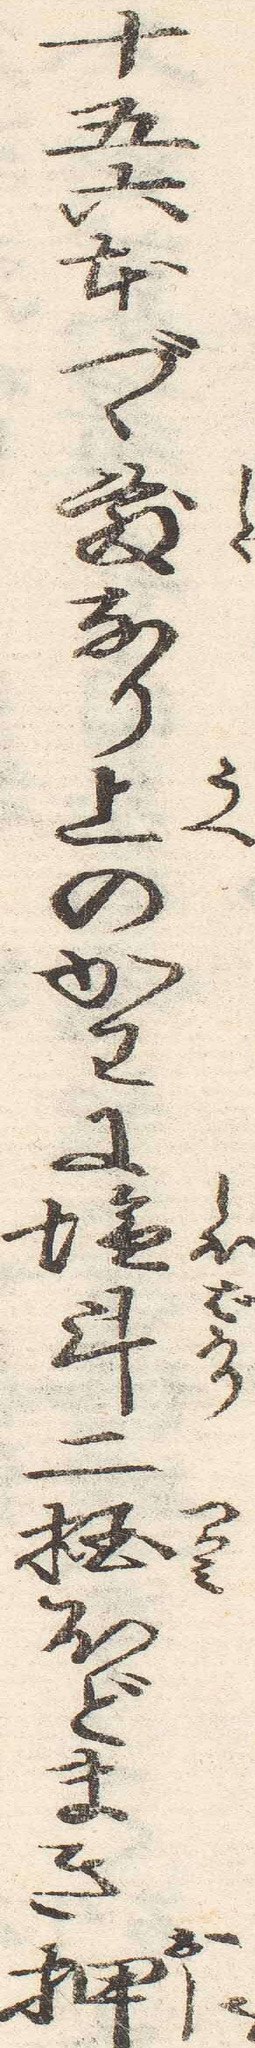十五六本づゝ敷なり上のかわに塩斗二掴ほどまき押
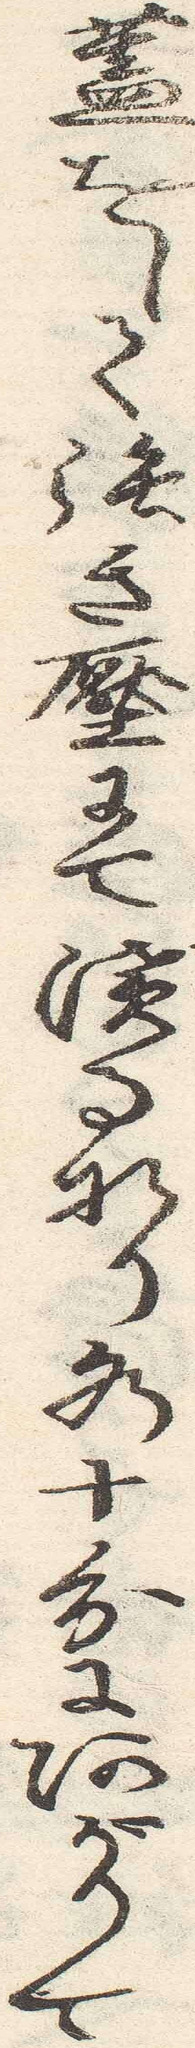蓋をして強き圧にて漬るなり水十分にあがりて
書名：四季漬物塩嘉言
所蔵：東京学芸大学附属図書館 国文学研究資料館
